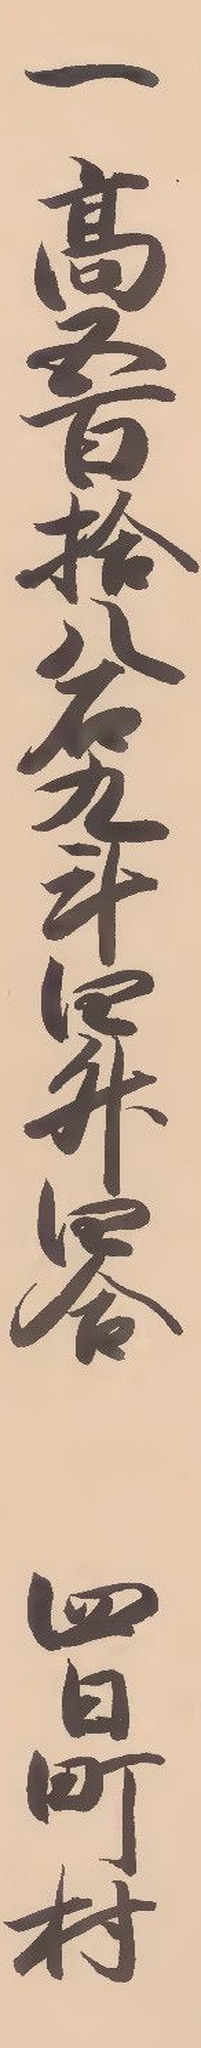一高五百拾八石九斗四升四合四日町村
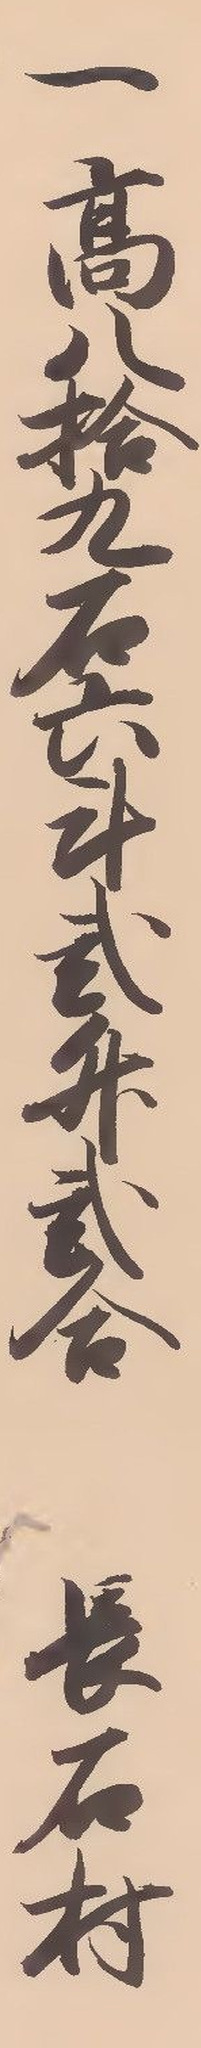一高八拾九石六斗弐升弐合長石村
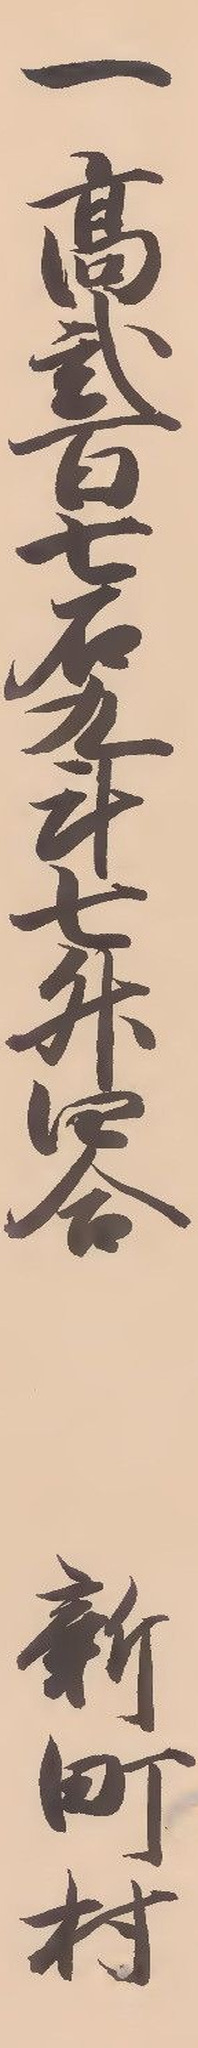一高弐百七石九斗七升四合新町村
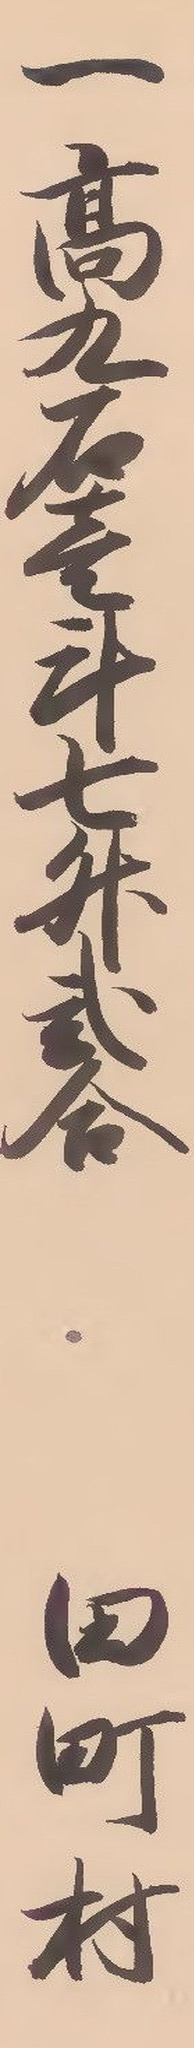一高九石壱斗七升弐合田町村

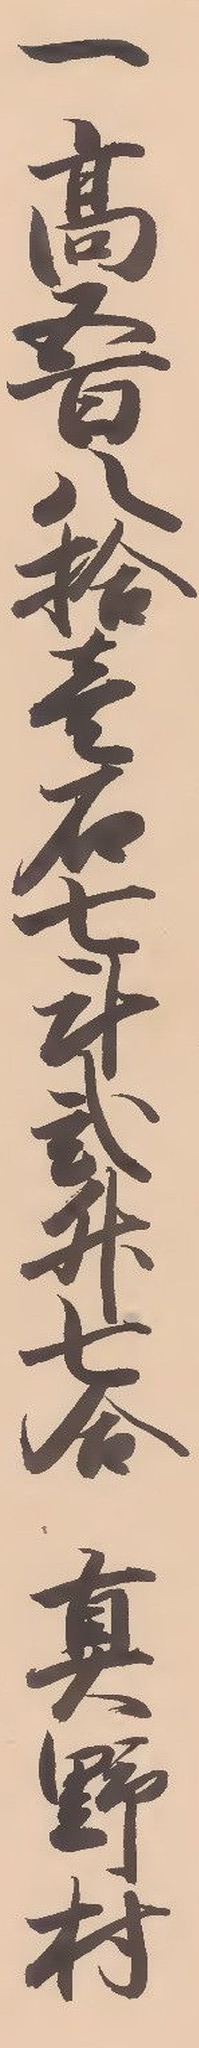一高五百八拾壱石七斗弐升七合真野村
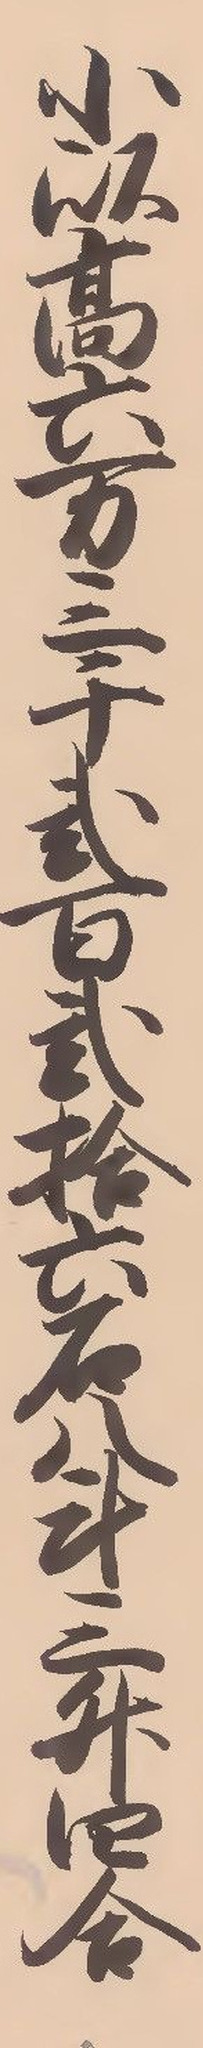小以高六万三千弐百弐拾六石八斗三升四合
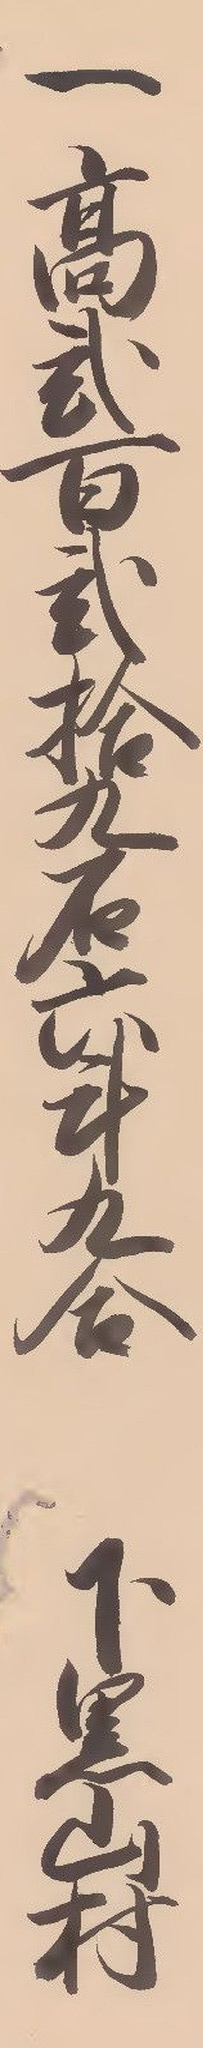一高弐百弐拾九石六斗九合下黒山村
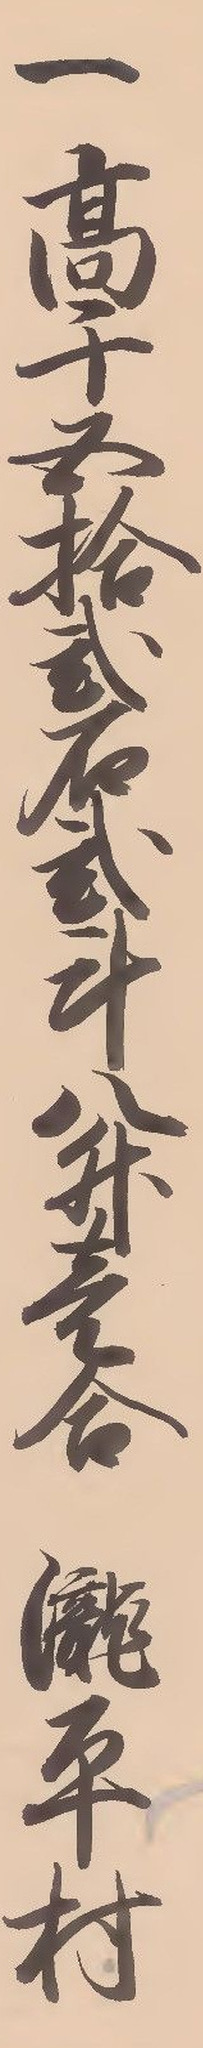一高千五拾弐石弐斗八升壱合滝平村
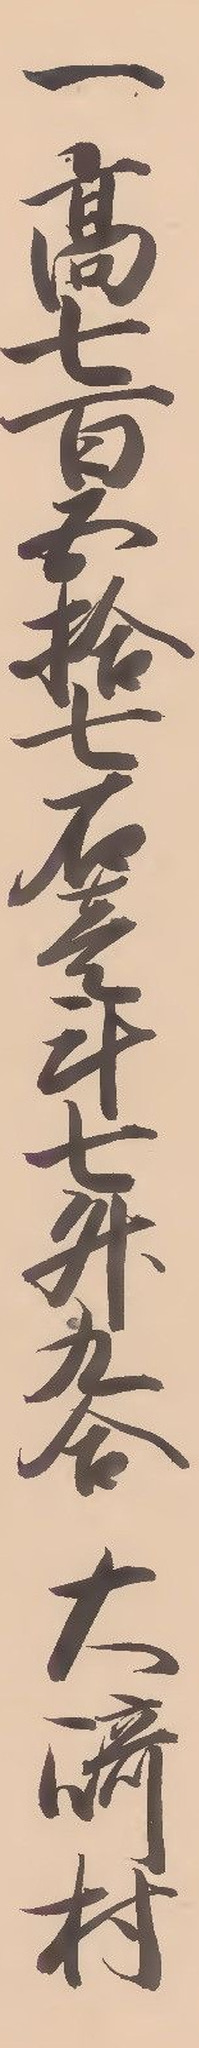一高七百五拾七石壱斗七升九合大崎村

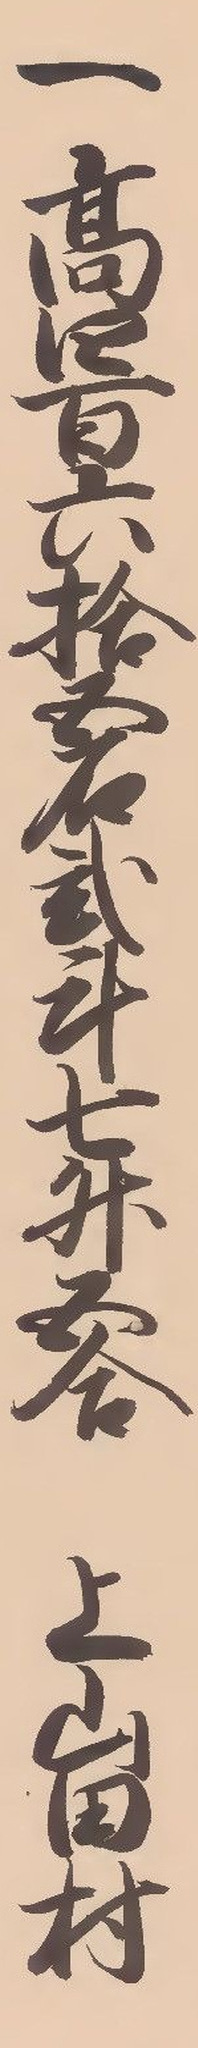一高四百六拾五石弐斗七升五合上山田村
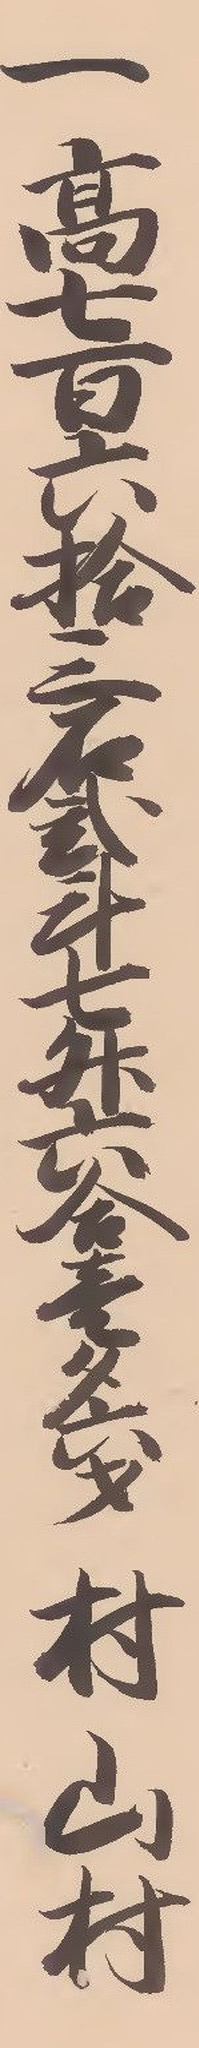一高七百六拾三石弐斗七升六合壱勺六才村山村
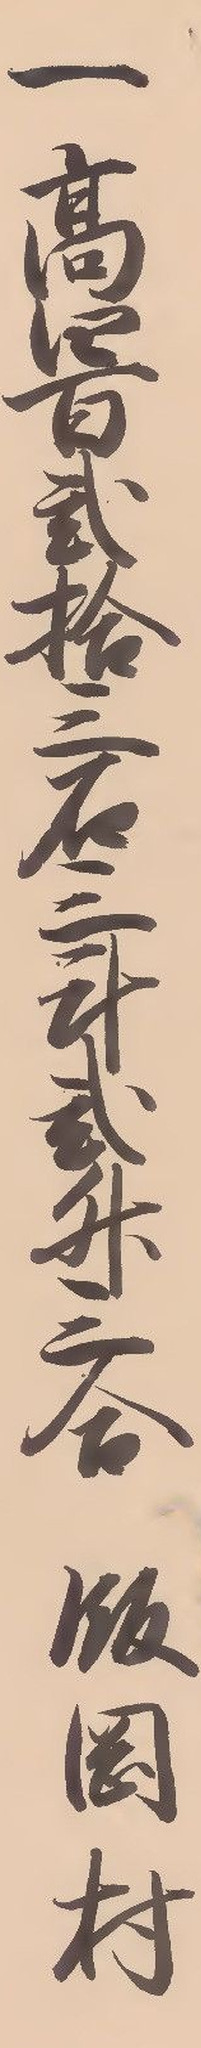一高四百弐拾三石三斗弐升三合飯岡村
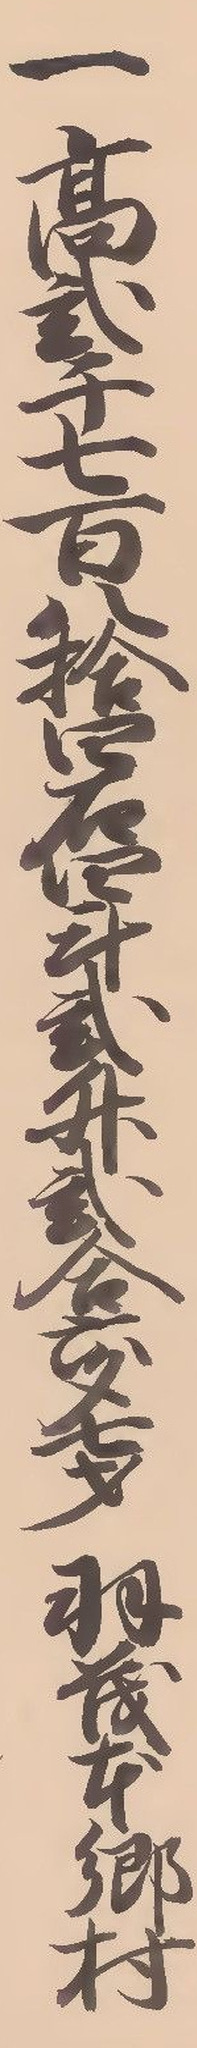一高弐千七百八拾四石四斗弐升弐合六勺七才羽茂本郷村
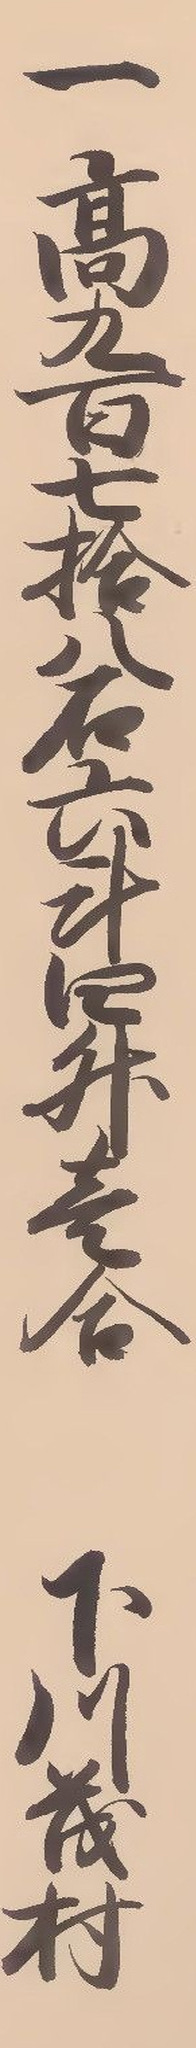一高九百七拾八石六斗四升壱合下川茂村
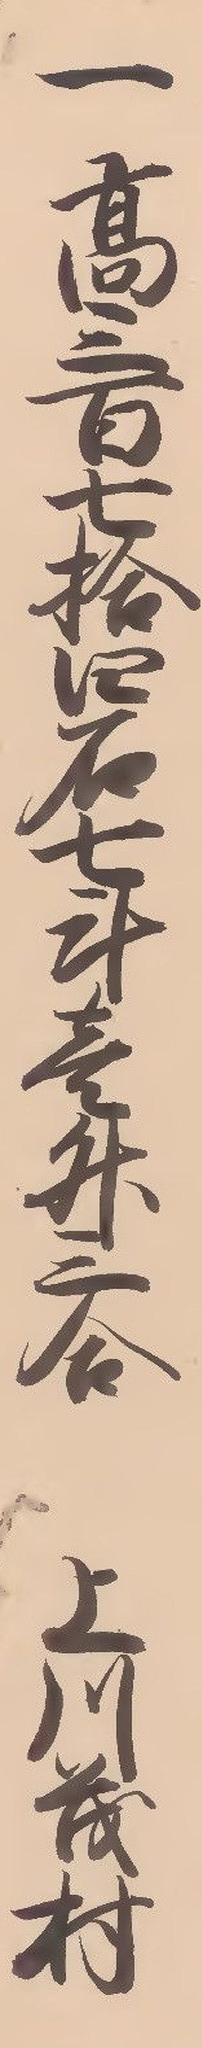一高三百七拾四石七斗壱升三合上川茂村
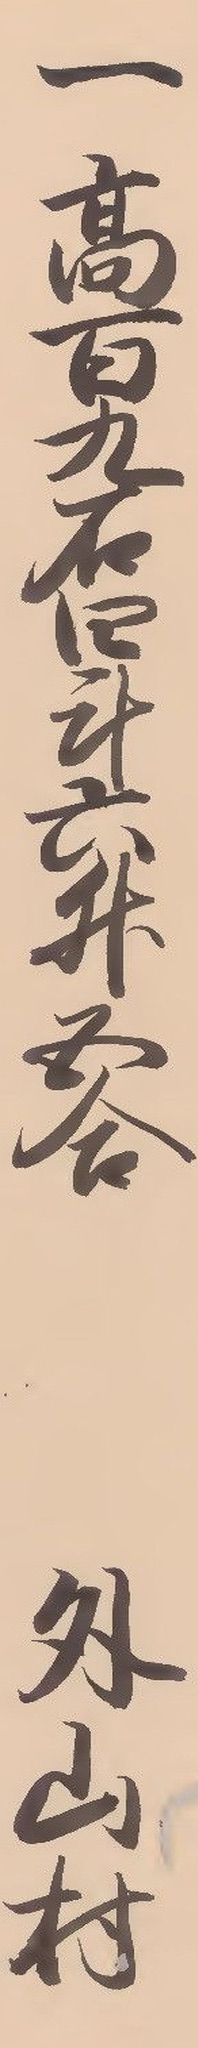一高百九石四斗六升五合外山村
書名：佐渡国郷帳
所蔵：国立公文書館 National Archives of Japan
